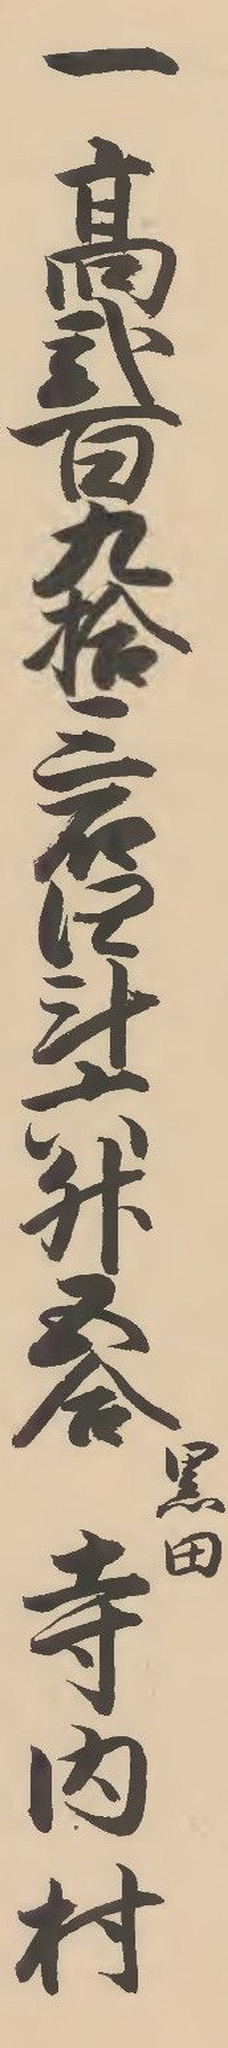一髙弐百九拾三石四斗六升五合寺内村

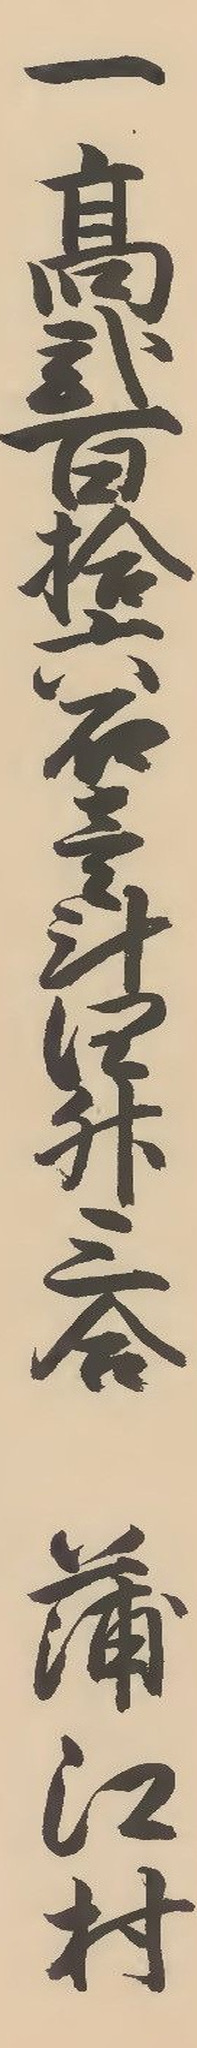一髙弐百拾六石壱斗四升三合蒲江村
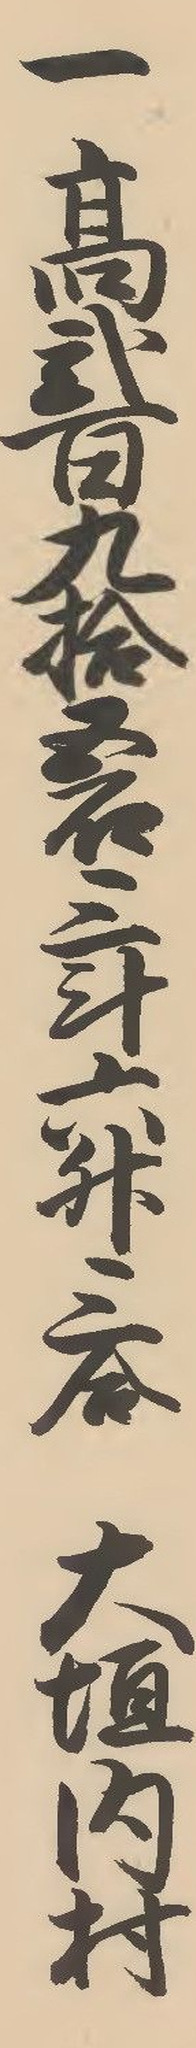一髙弐百九拾五石三斗六升三合大垣内村
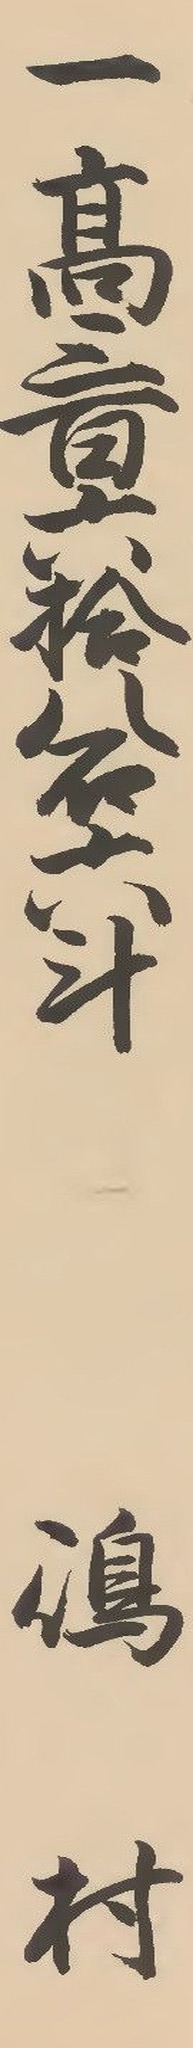一髙三百六拾八石六斗嶋村
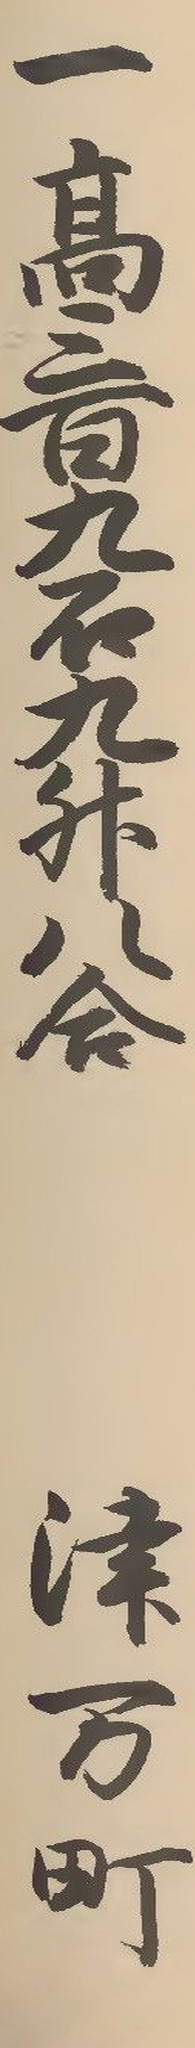一髙三百九石九升八合津万町
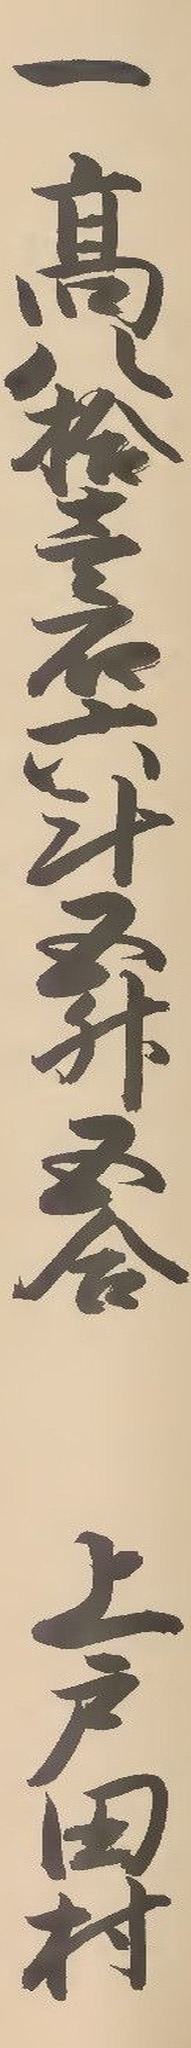一髙八拾壱石六斗五升五合上戸田村
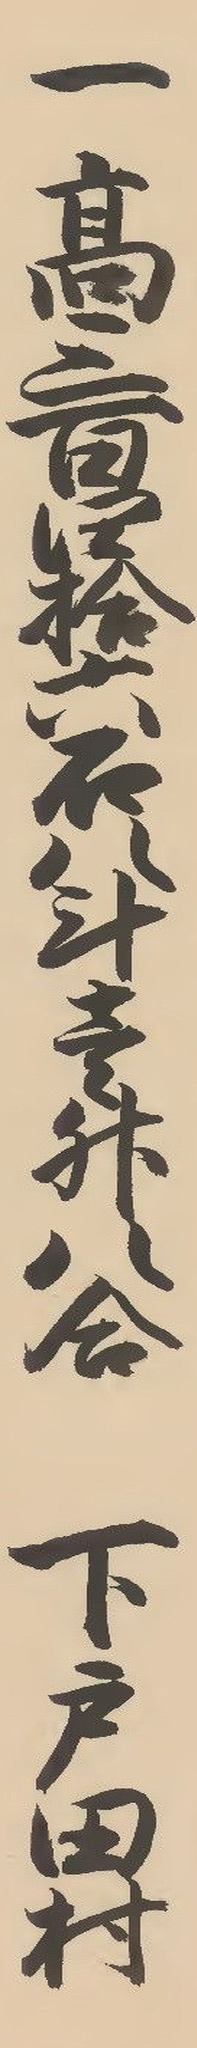一髙三百四拾六石八斗壱升八合下戸田村
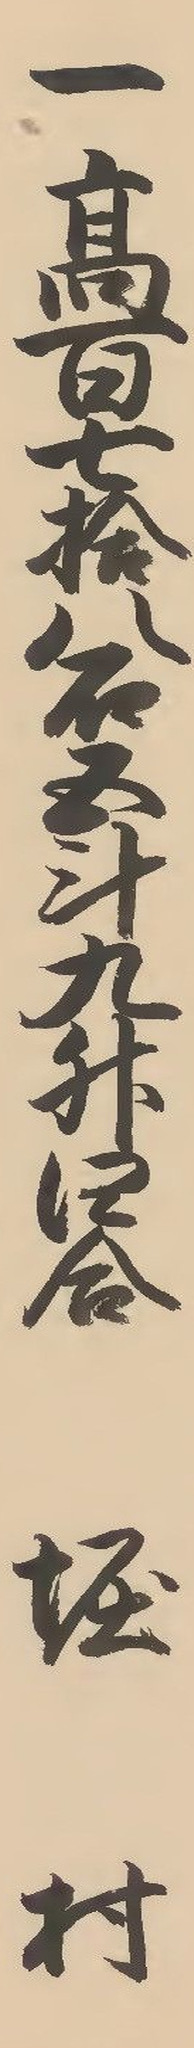一髙百七拾八石五斗九升四合堀村
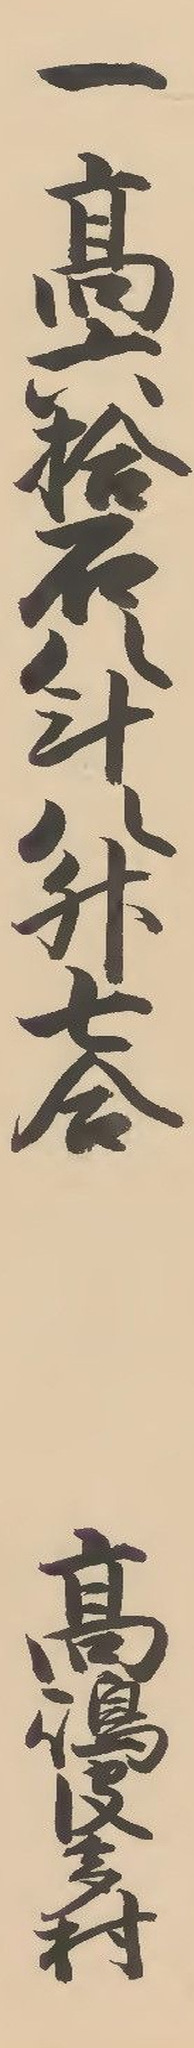一髙六拾石八斗八升七合高嶋皮多村

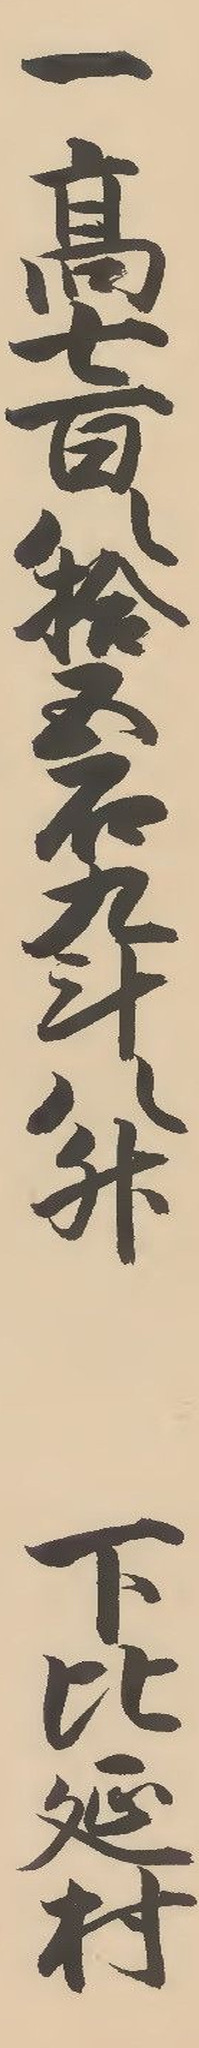一髙七百八拾五石九斗八升下比延村
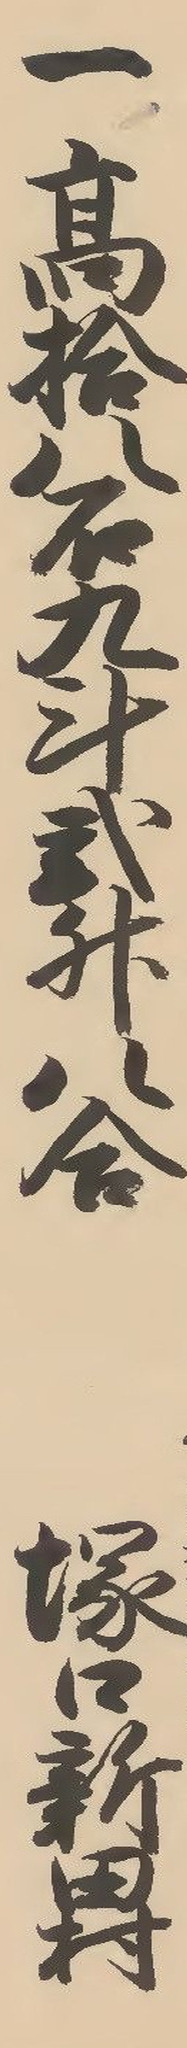一髙拾八石九斗弐升八合塚口新田村
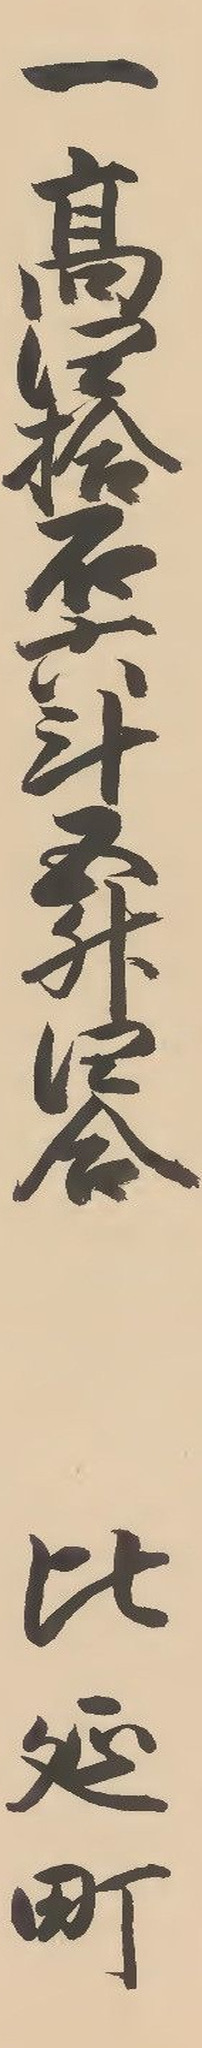一髙四拾石六斗五升四合比延町
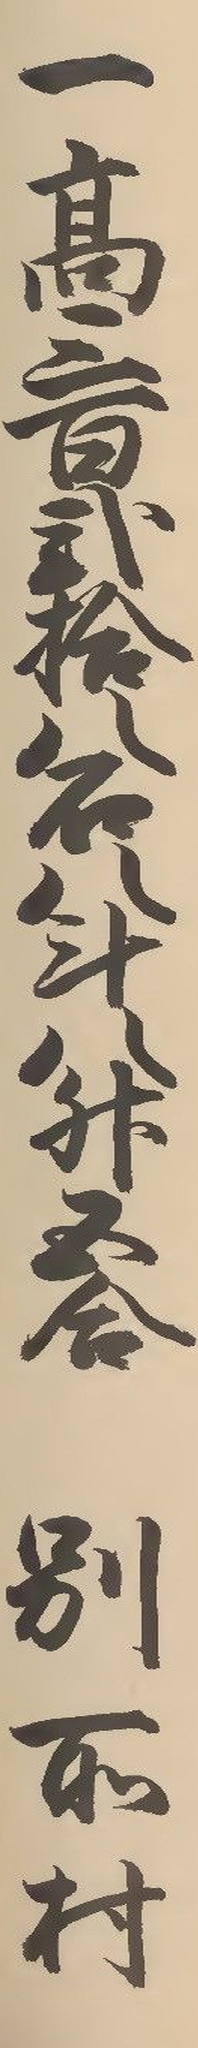一髙三百弐拾八石八斗八升五合別所村
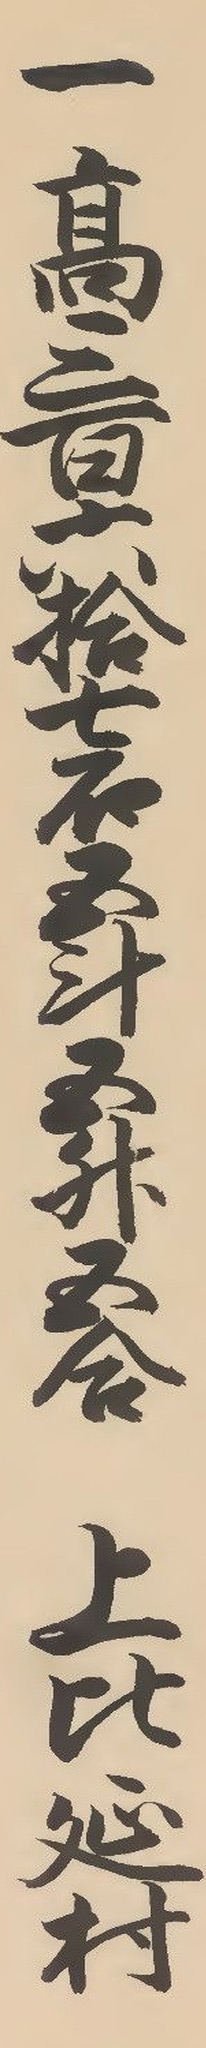一髙三百六拾七石五斗五升五合上比延村
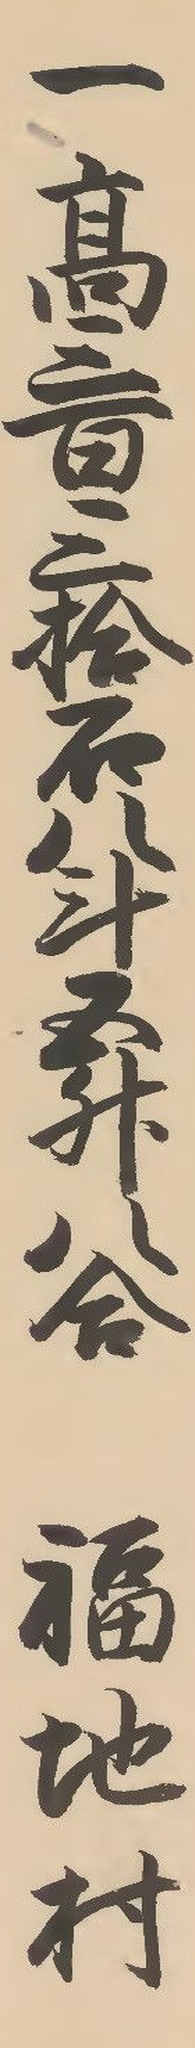一髙三百三拾石八斗五升八合福地村
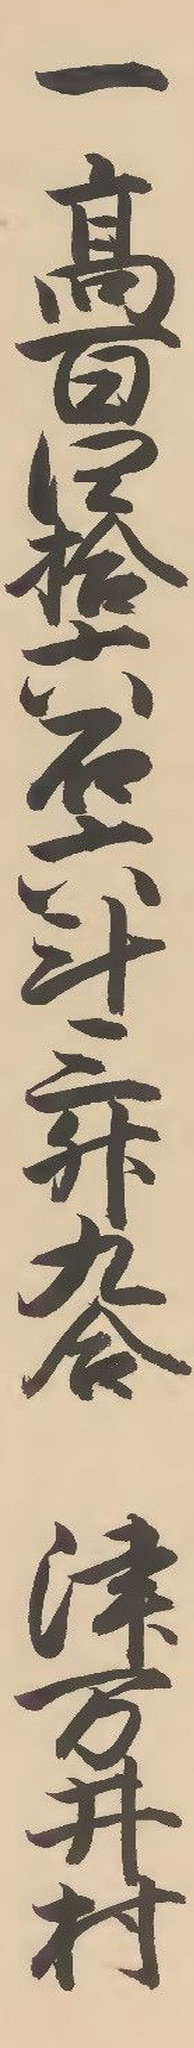一髙百四拾六石六斗三升九合津万井村
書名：播磨国郷帳
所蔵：国立公文書館 National Archives of Japan
